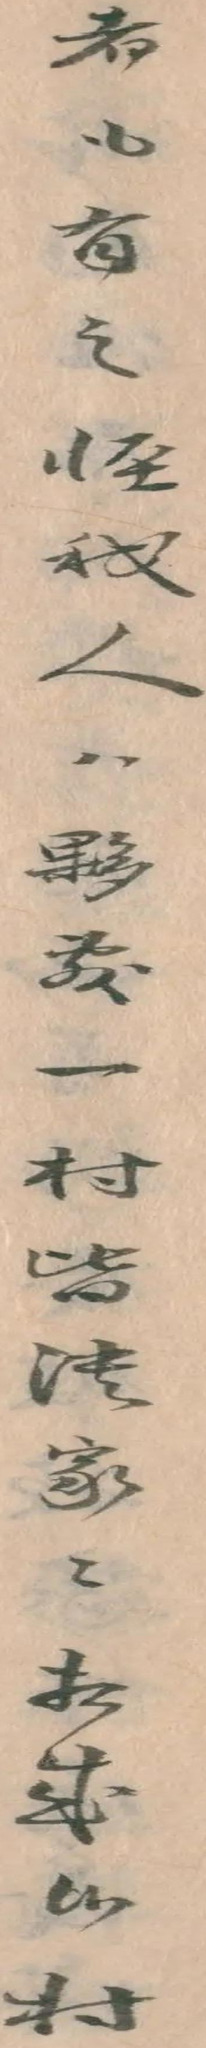者も有之怪我人ハ夥敷一村皆潰家ニ相成候村
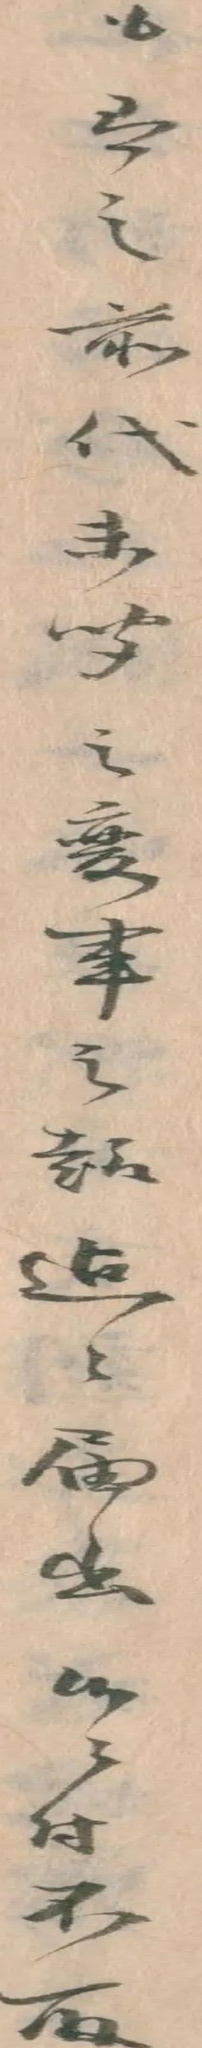も有之前代未聞之変事之趣追々届出候ニ付不取
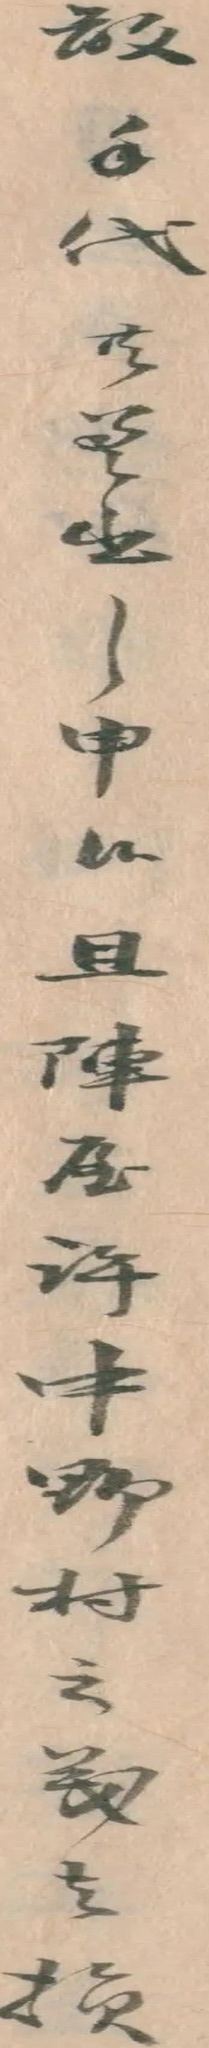敢手代共差出し申候且陣屋許中野村之儀者損
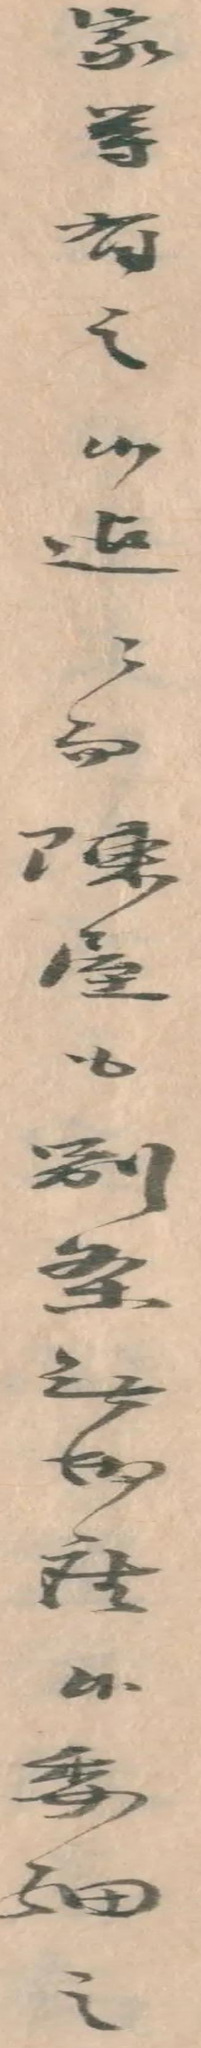家等有之候迄ニ而陣屋も別条無御座候委細之
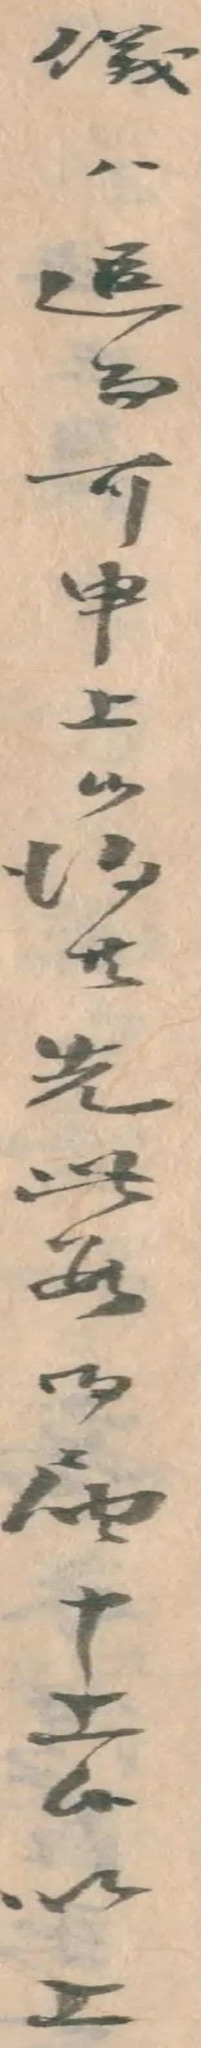儀ハ追而可申上候得共先此段御届申上候以上

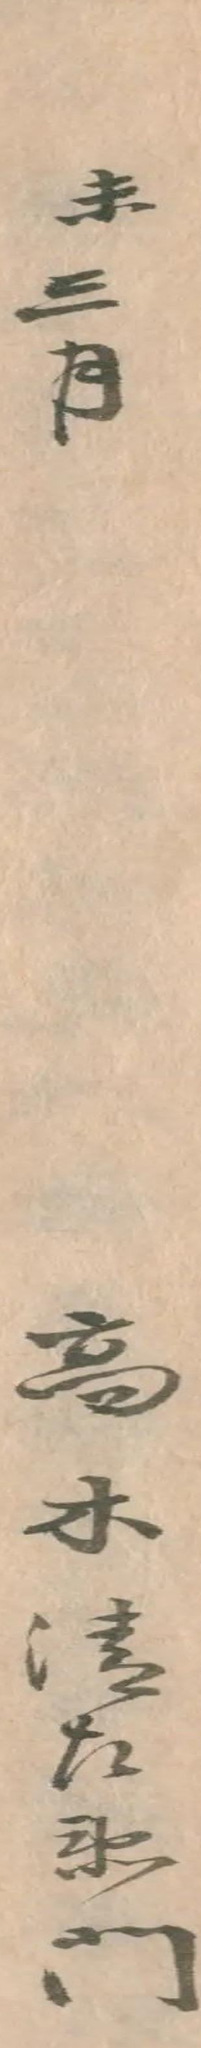未三月高木清左衛門
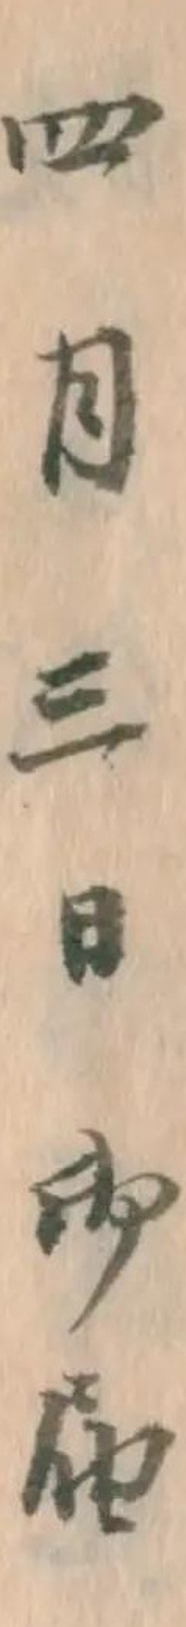四月三日御届
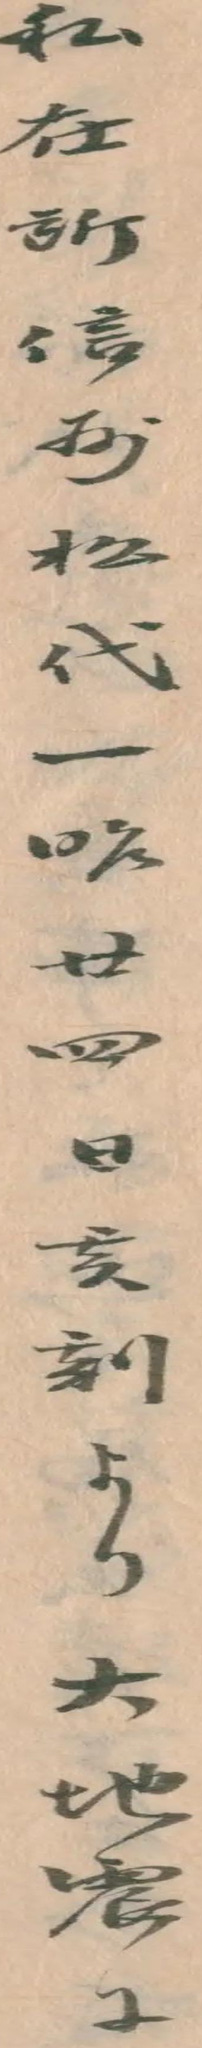私在所信州松代一昨廿四日亥刻より大地震に
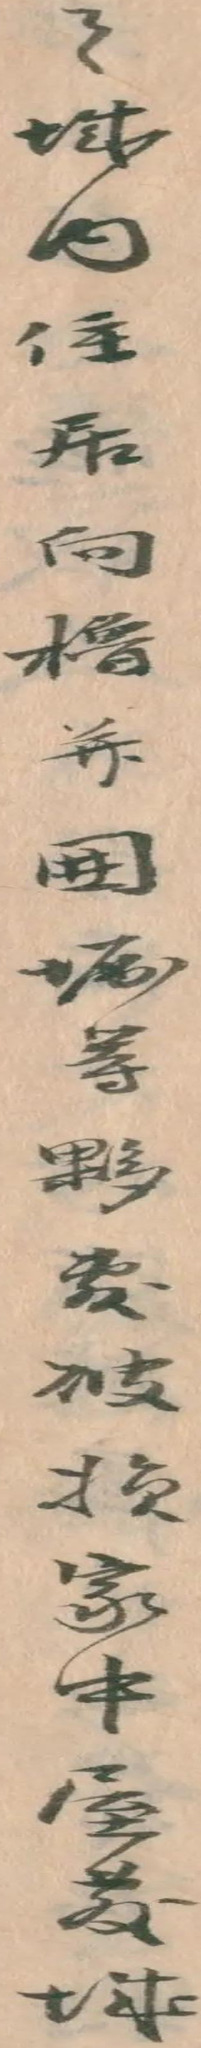て城内住居向櫓并囲塀等夥敷破損家中屋敷城
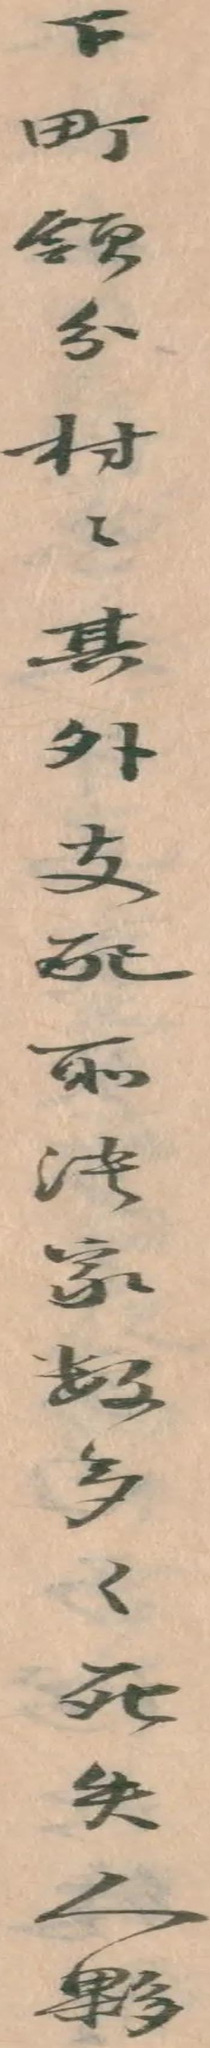下町領分村々其外支配所潰家数多く死失人夥
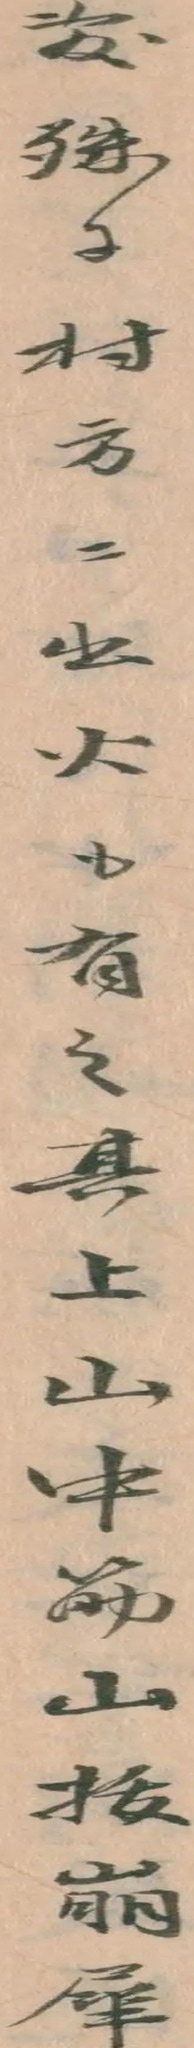敷殊に村方ニ出火も有之其上山中筋山抜崩犀
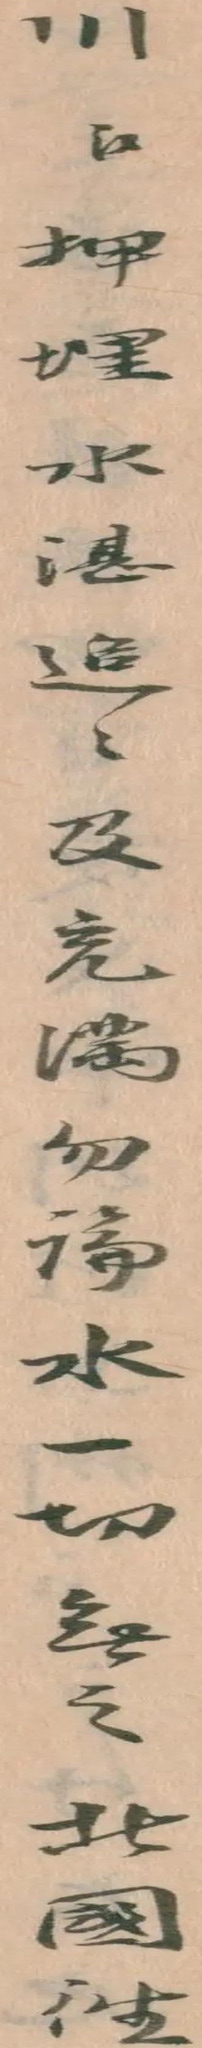川江押埋水湛追々及充満勿論水一切無之北国往
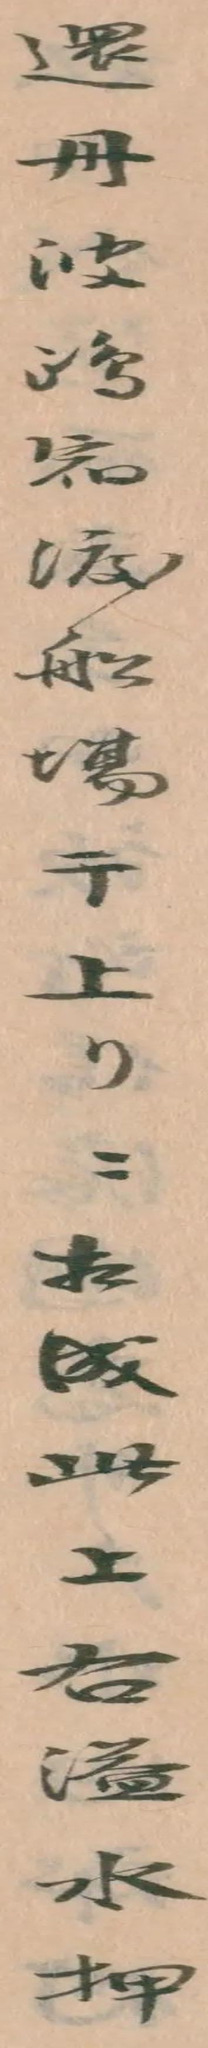還丹波島宿渡船場干上りニ相成此上右溢水押
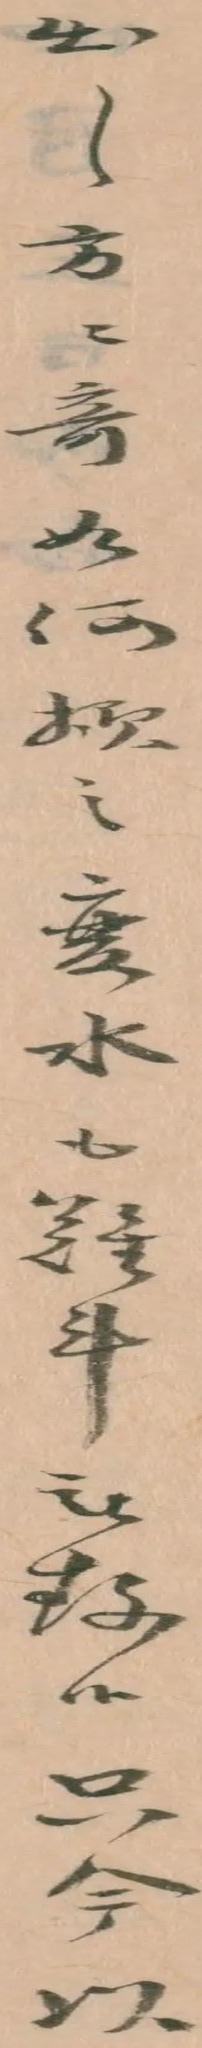出し方ニ寄如何様之変水も難計奉存候只今以
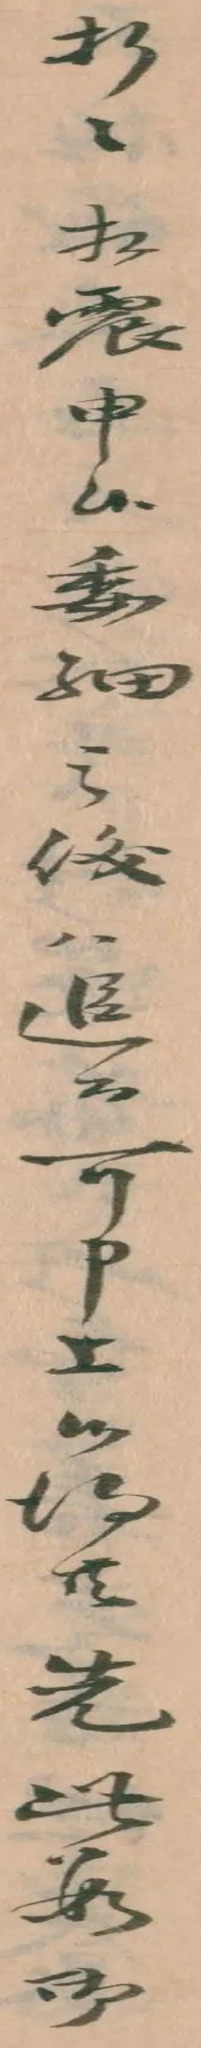折々相震申候委細之儀ハ追而可申上候得共先此段御
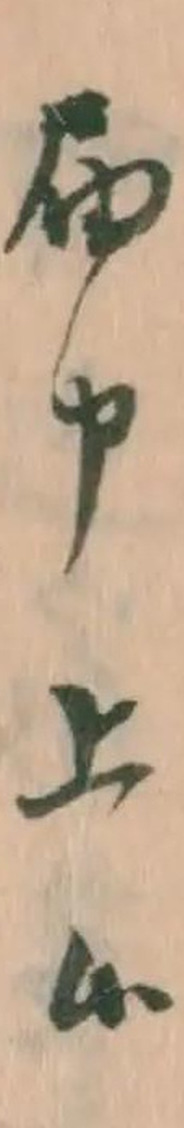届申上候
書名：地災撮要. 巻3(地震之部)-巻4(噴火之部)
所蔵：国立国会図書館 National Diet Library, JAPAN
